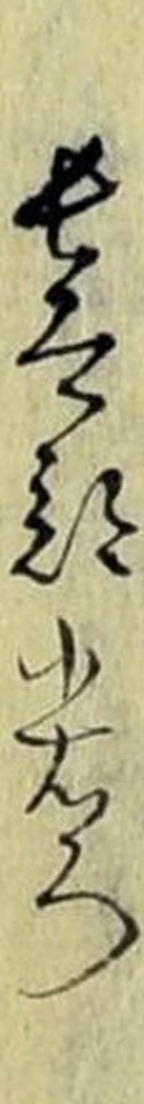長谷部小右衛門
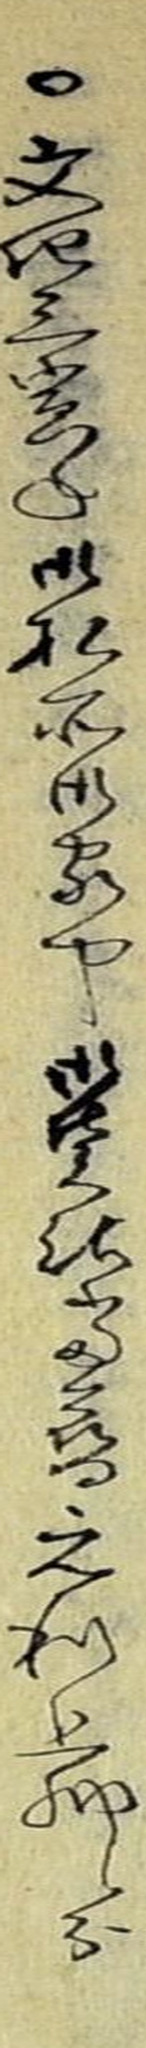○文化三寅年御札所御家中御貸銀当暮元利上納分
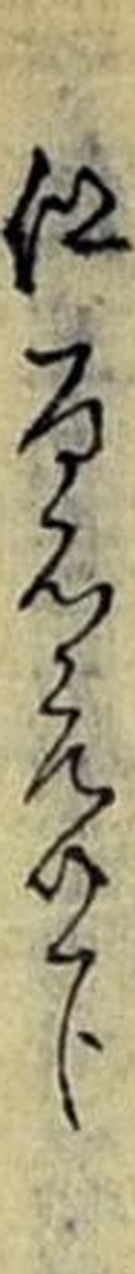但百石取以下
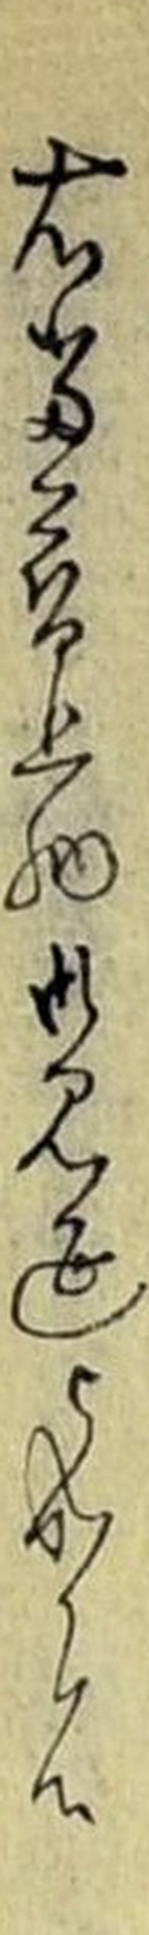右当暮上納御見延被成下候
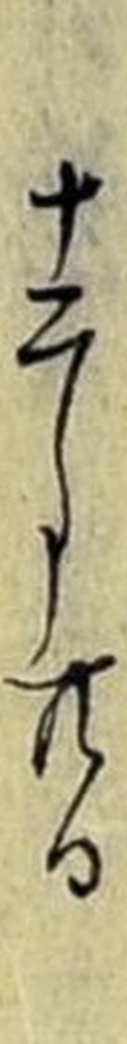十二月廿日

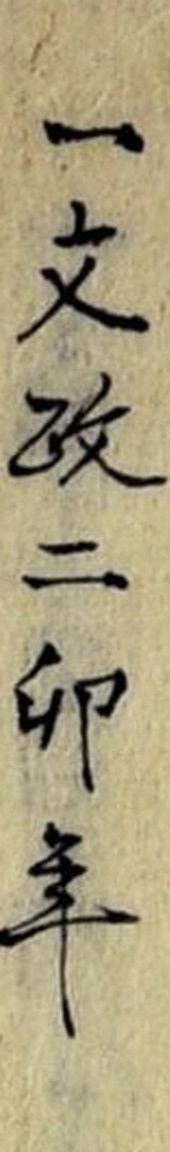一文政二卯年
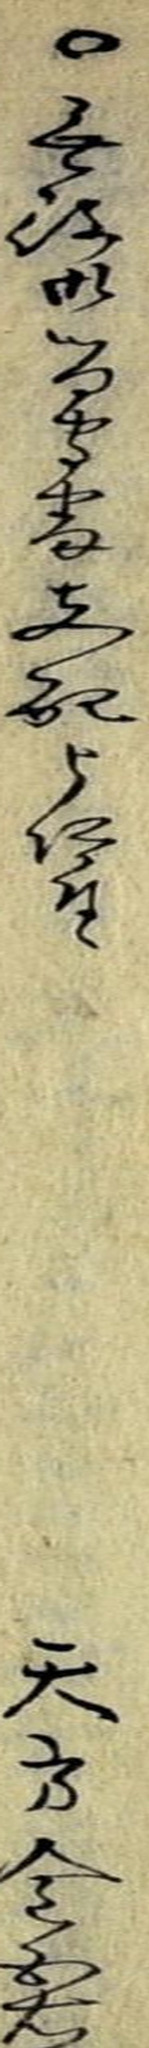○無役御留守番支配被仰付候天方金五右衛門
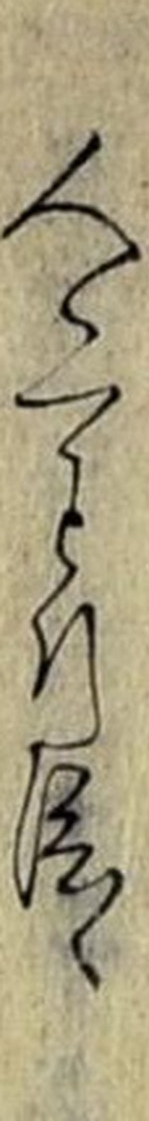人へ可被引渡候
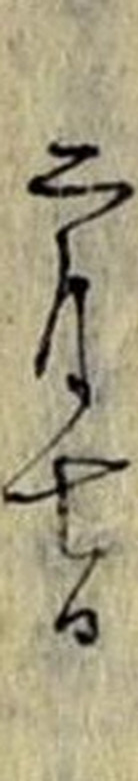二月七日
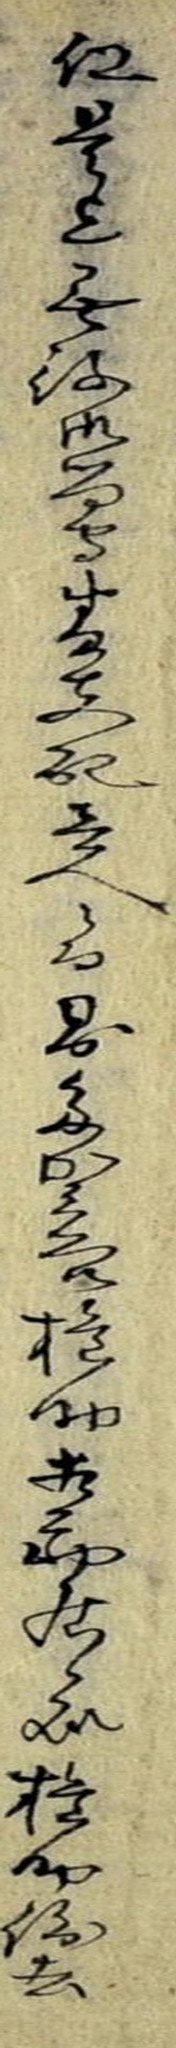但是迄無役御留守番支配壱人に而則多賀谷権助相勤居候処権助儀去
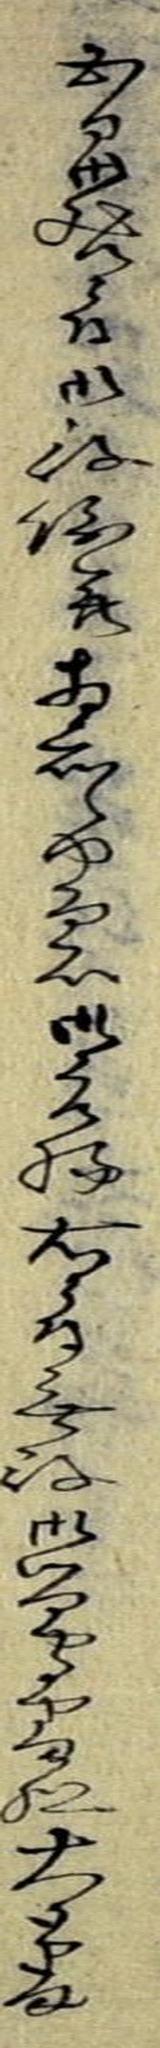五日御咎に付御役儀并拝知之内百石御取揚右に付無役御留守組大御番
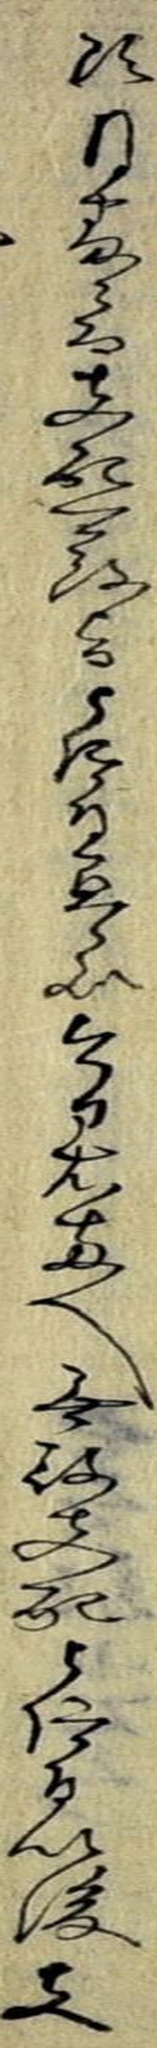頭月番に而支配可致旨被仰付置候処今日右両人無役支配被仰付以後支
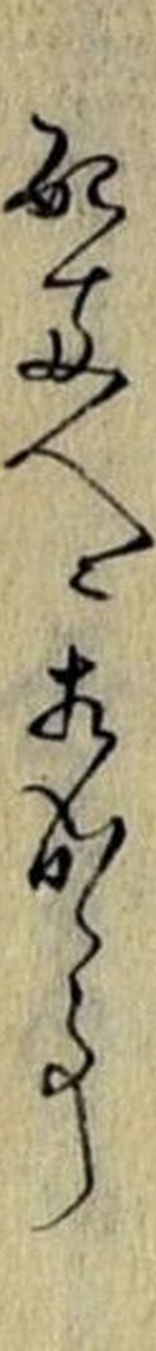配両人に相成候事
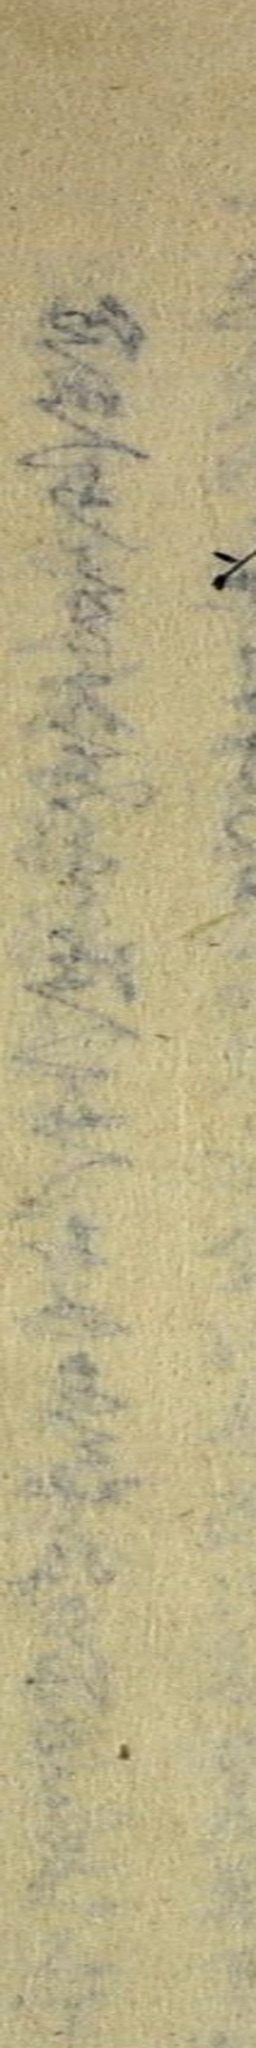二月廿四日
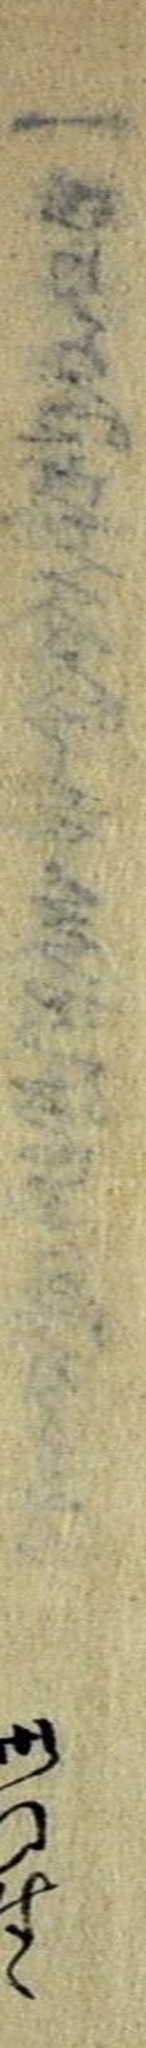御目付へ
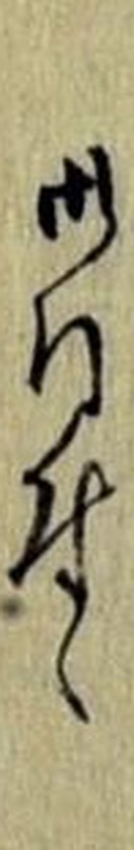御目付へ
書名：命令之部 四
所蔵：福井県文書館 Fukui Prefectural Archives
